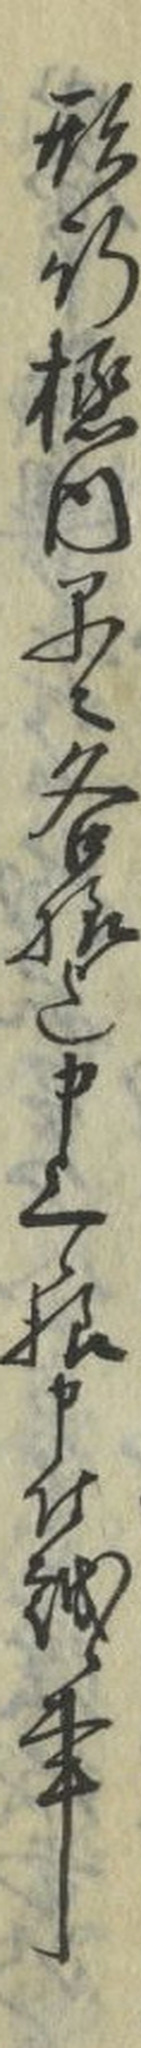形行極内早々各様迄申上候様申付越候事
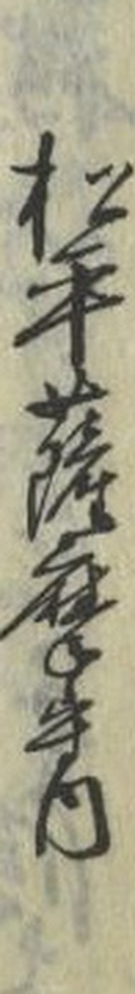松平薩摩守内
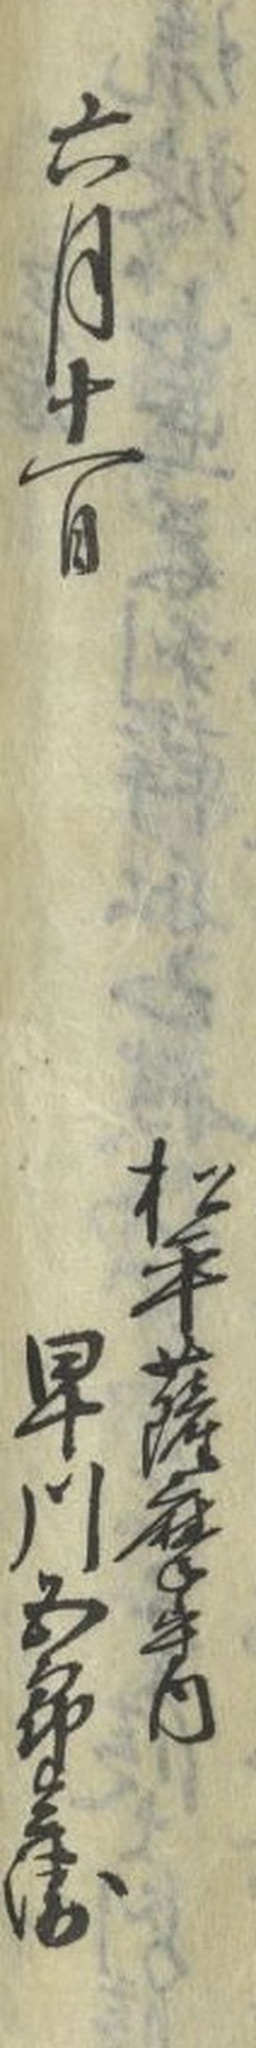六月十一日早川五郎兵衛
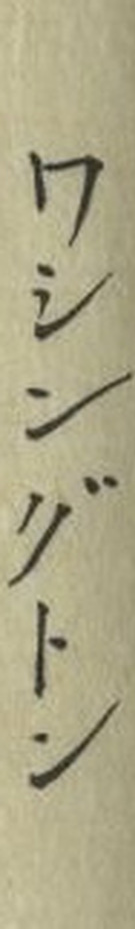ワシングトン
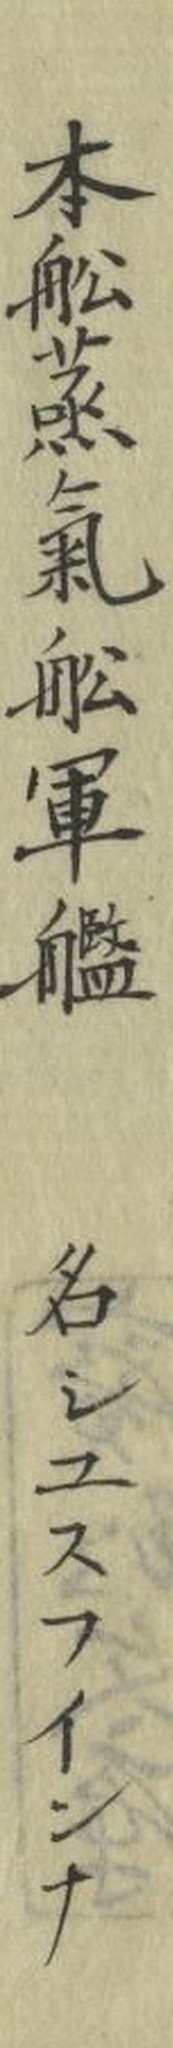本船蒸気船軍艦名シユスフィンナ
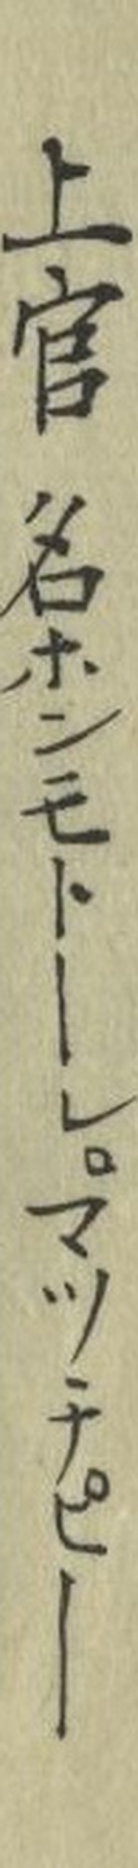上官名ホンモトーレ。マツチピー
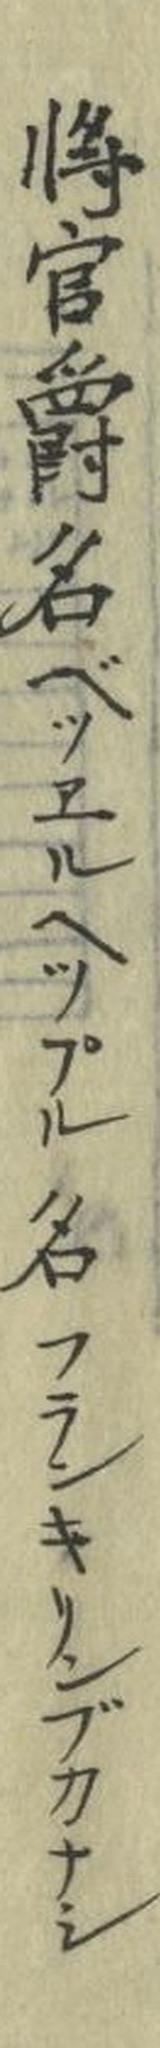将官爵名ベツヱルヘツプル名フランキリンブカナシ
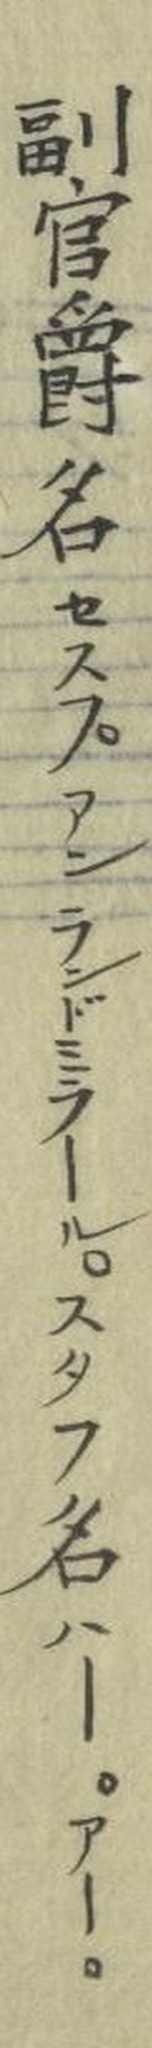副官爵名セスプアンランドミラール。スタフ名ハー。アー。
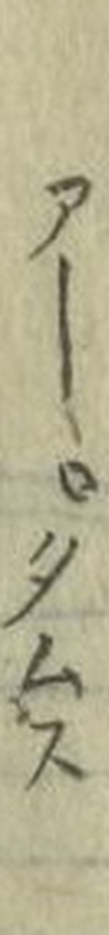アー。タムス
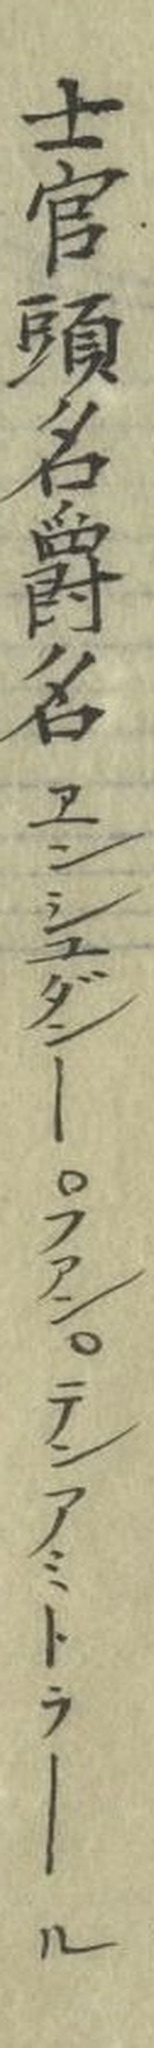士官頭名爵名ヱンシユダンー。フアン。テンアミトラール
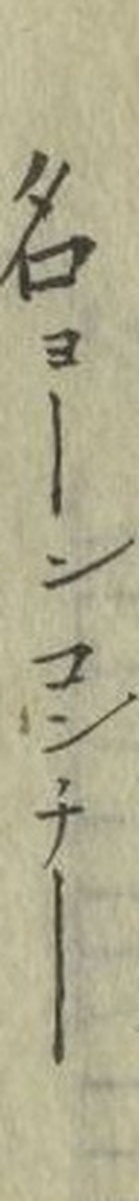名ヨーンコンチー
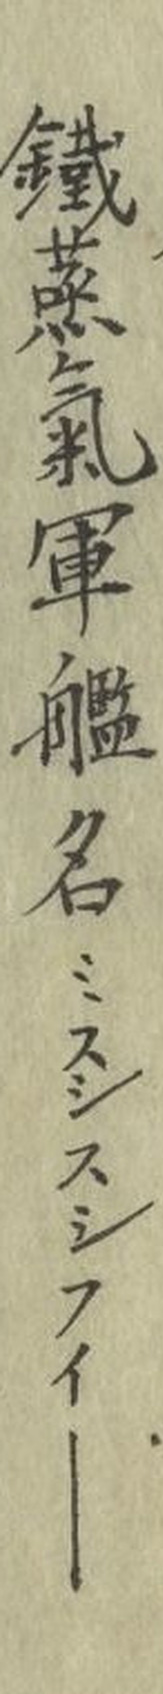鉄蒸気軍艦名ミスシスシフィー
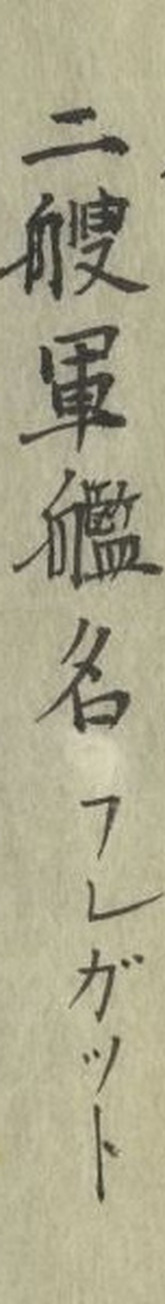二艘軍艦名フレガツト
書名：琉球へアメリカ船渡来書
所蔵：University of the Ryukyus Library
